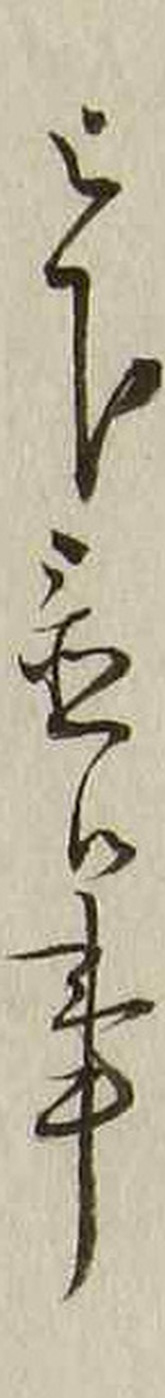被下置候事
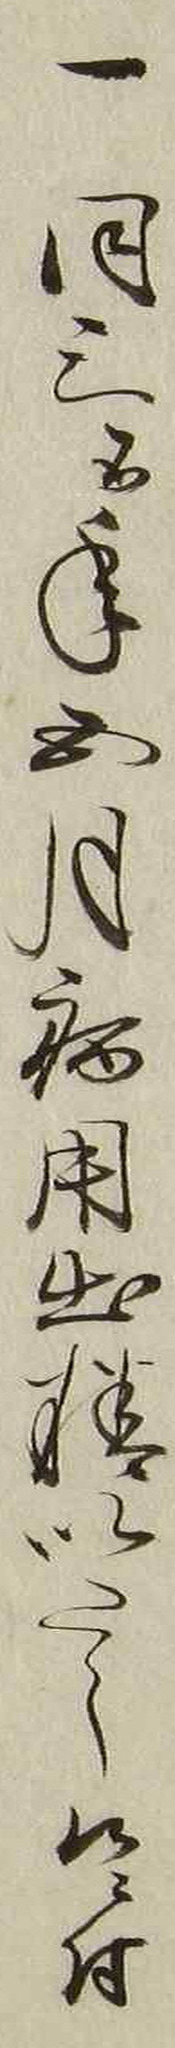一同三酉年五月病用出精いたし候に付
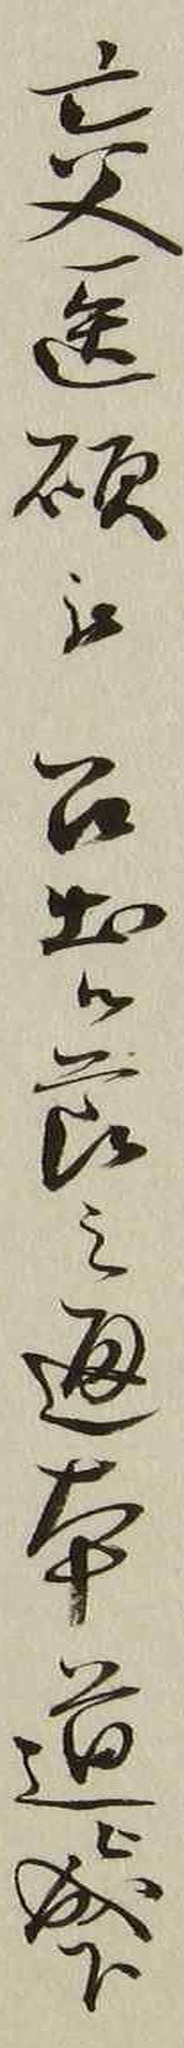亡父医碩被召出候節之通本道被成下
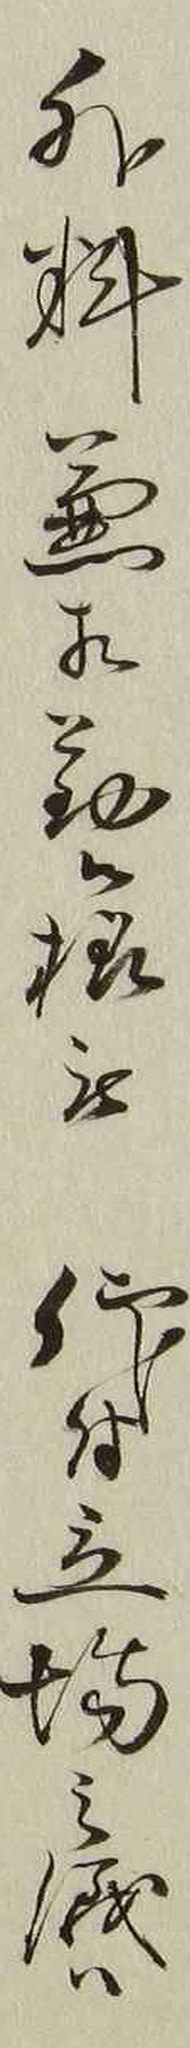外料兼相勤候様被仰付立場之儀は
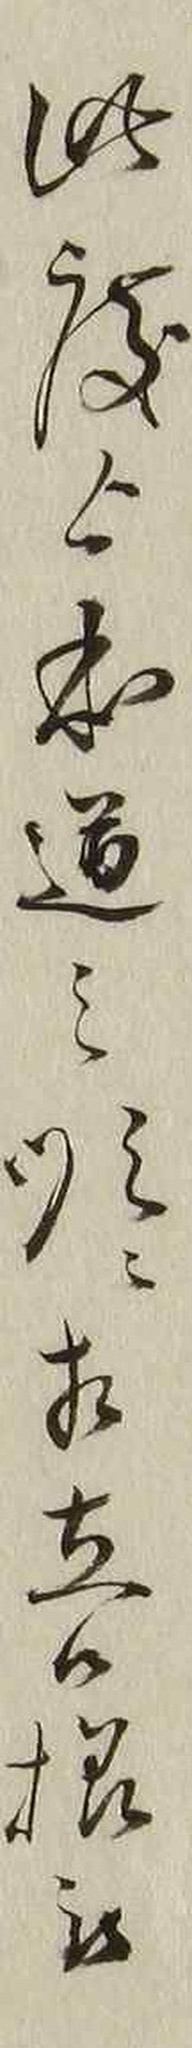此度ゟ本道之順に相立候様被
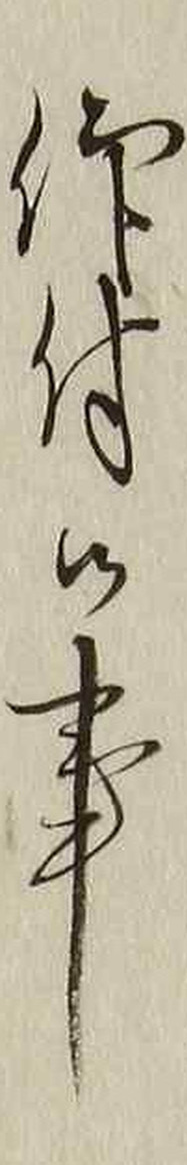仰付候事
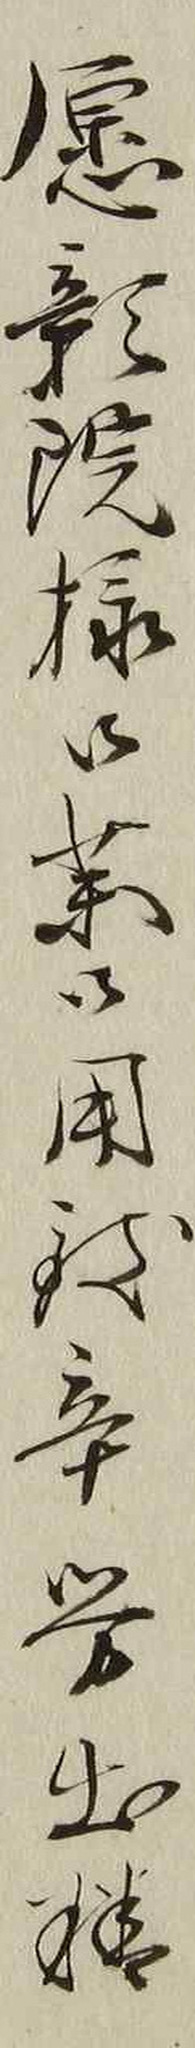愿彰院様御薬御用致辛労出精
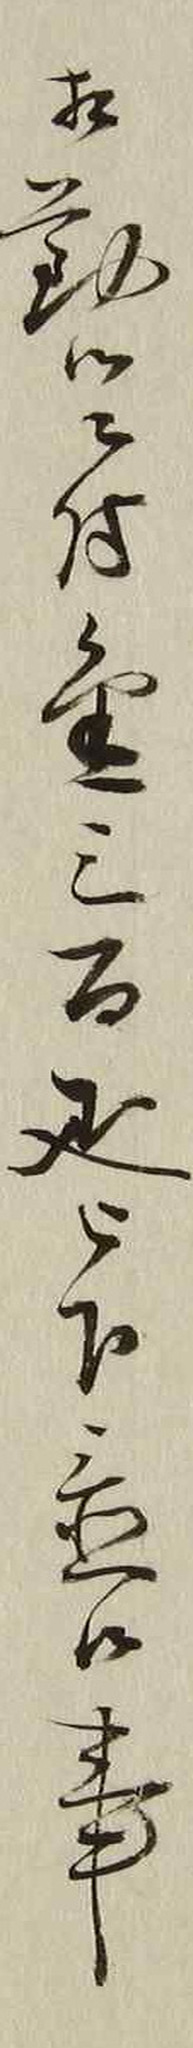相勤候に付金三百疋被下置候事
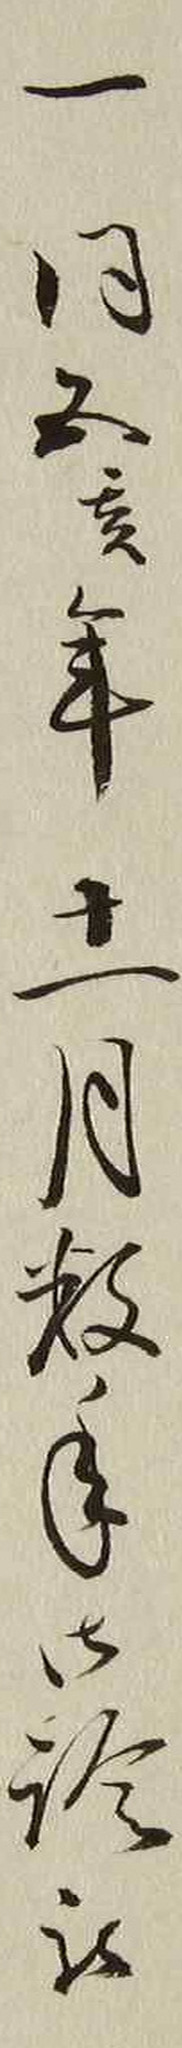一同五亥年十一月数年御診被
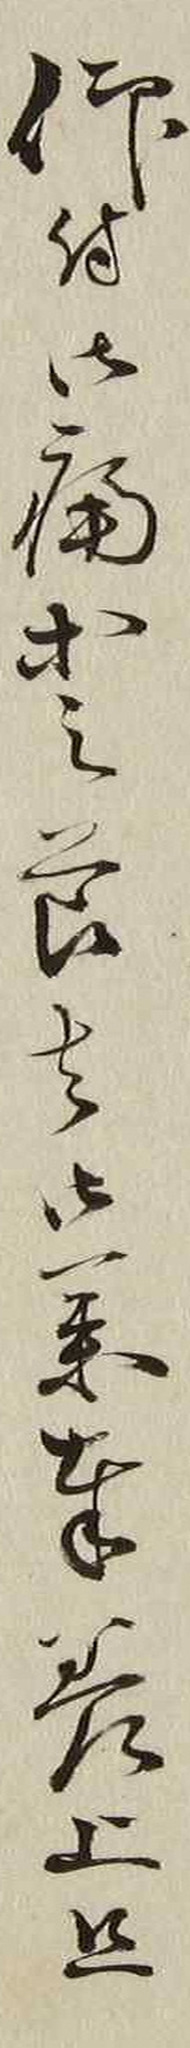仰付御痛等之節は御薬奉差上且
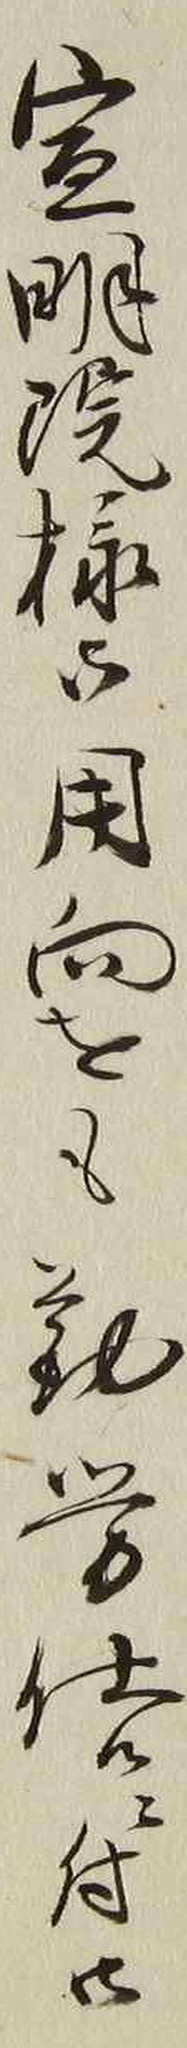宣明院様御用向をも勤労仕候に付御
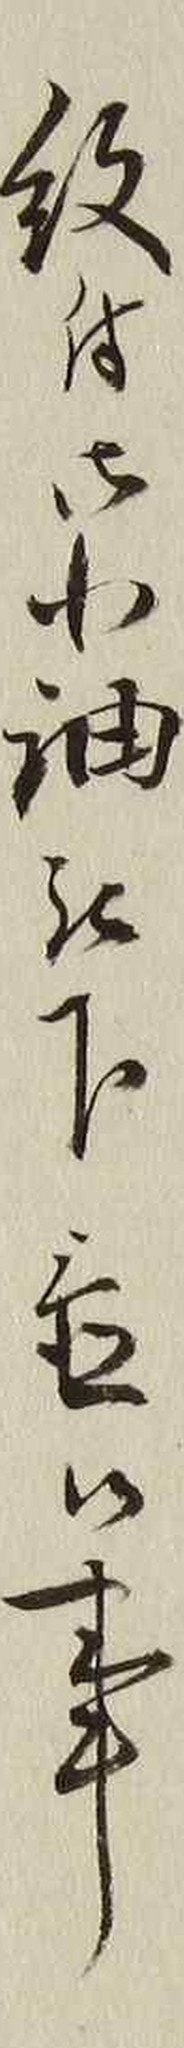紋付御小袖被下置候事
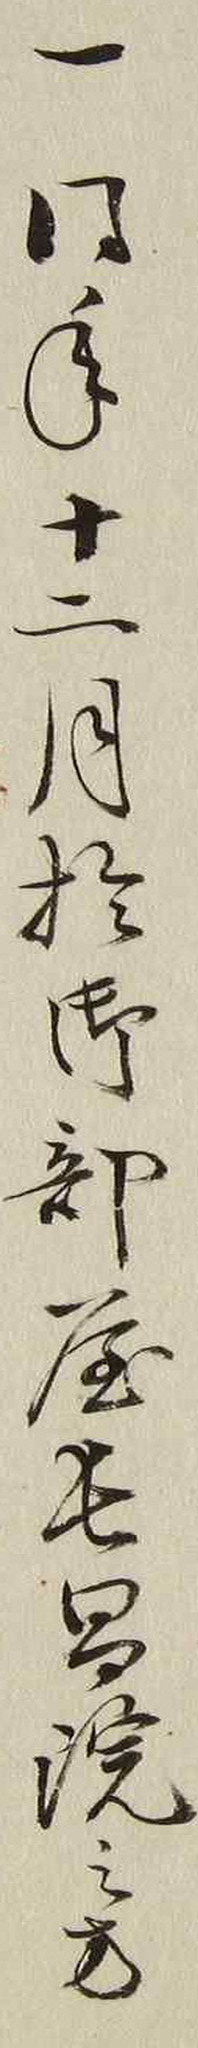一同年十二月於御部屋長昌院之方
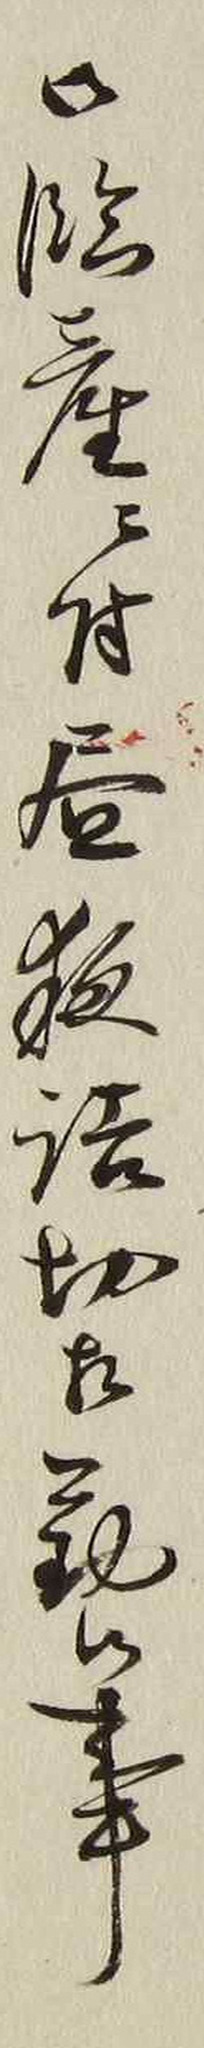御臨産に付昼夜詰切相勤候事
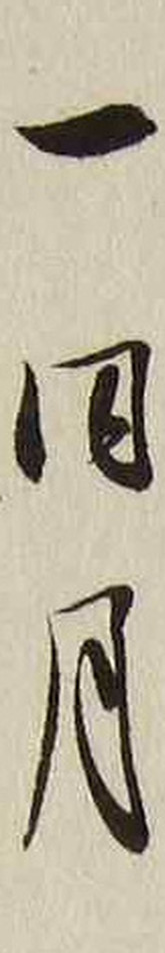一同月
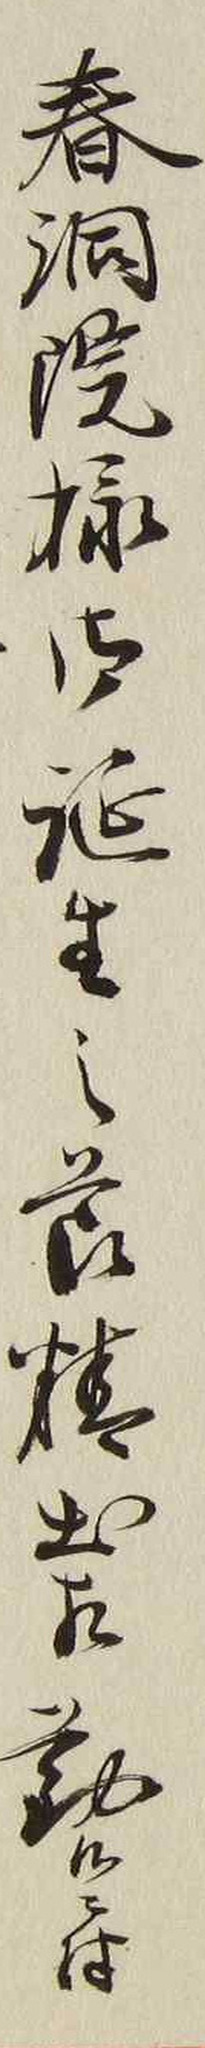春洞院様御誕生之節精出相勤候に付
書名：諸士系譜　巻之157　ね之部1
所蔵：会津若松市立会津図書館
